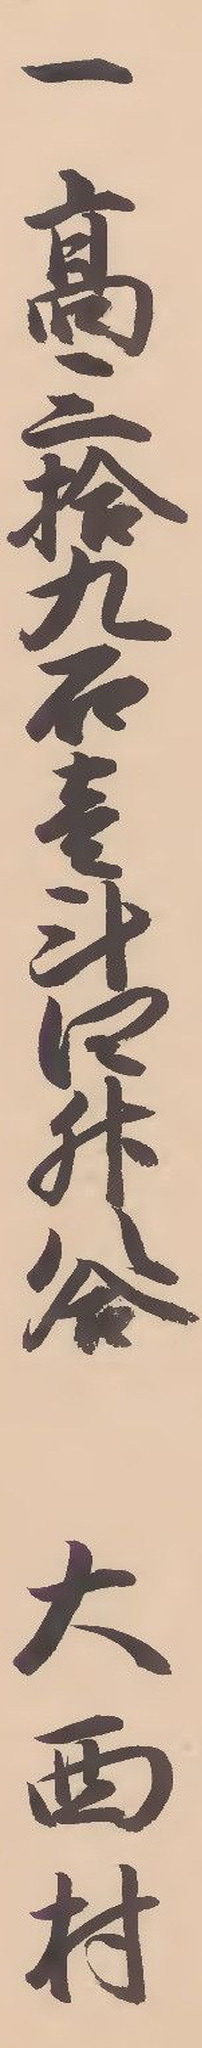一高三拾九石壱斗四升八合大西村

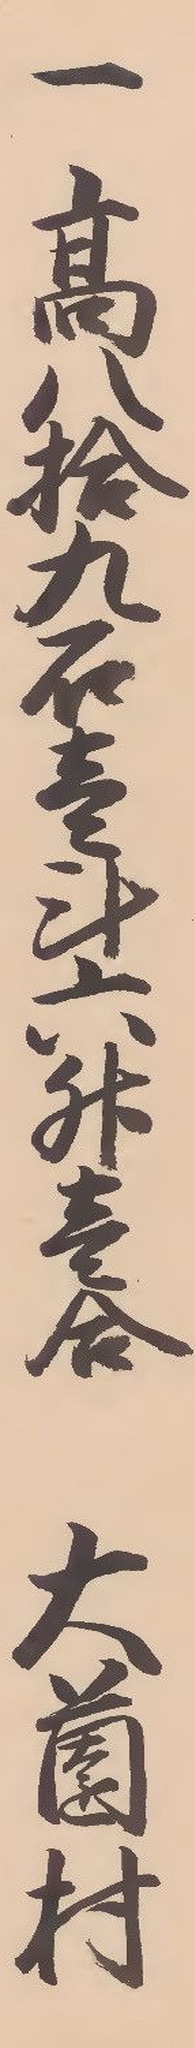一高八拾九石壱斗六升壱合大薗村
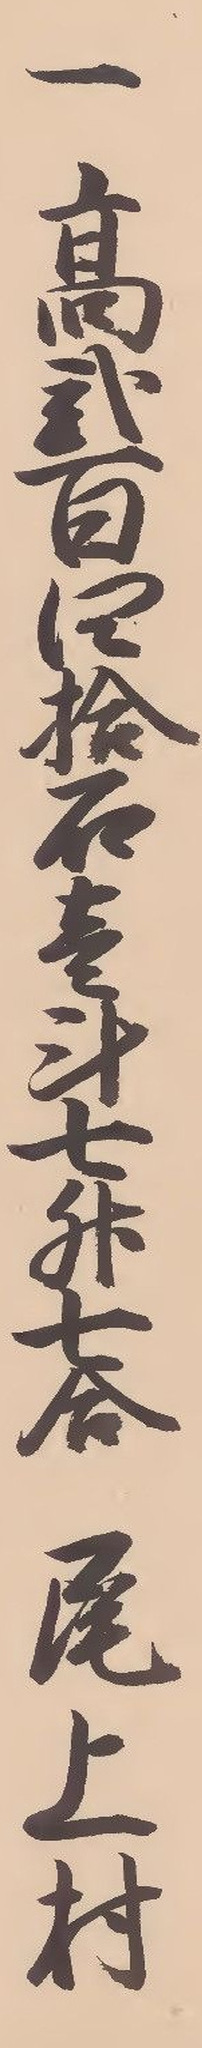一高弐百四拾石壱斗七升七合尾上村
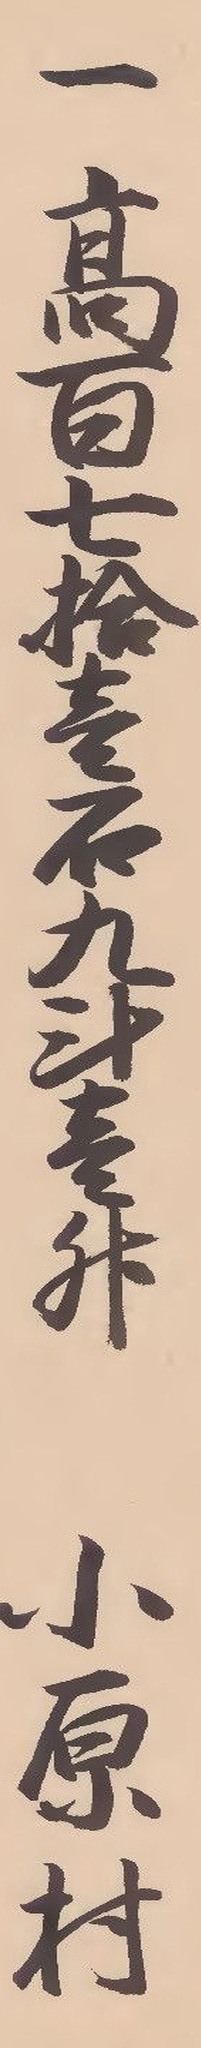一高百七拾壱石九斗壱升小原村
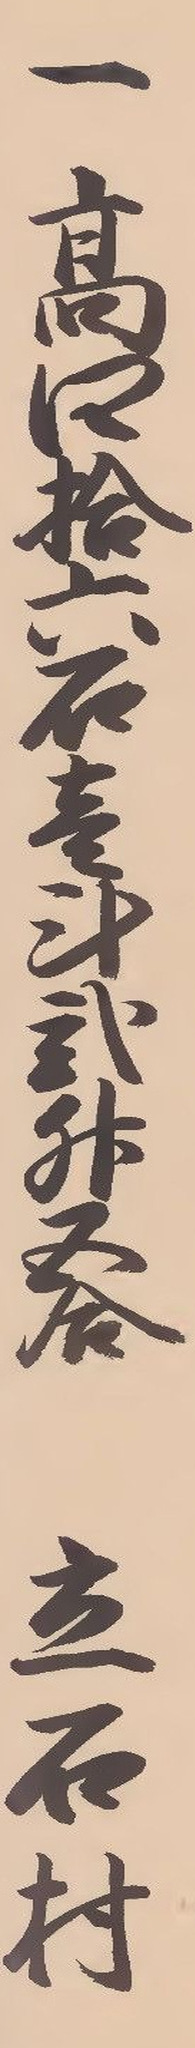一高四拾六石壱斗弐升五合立石村
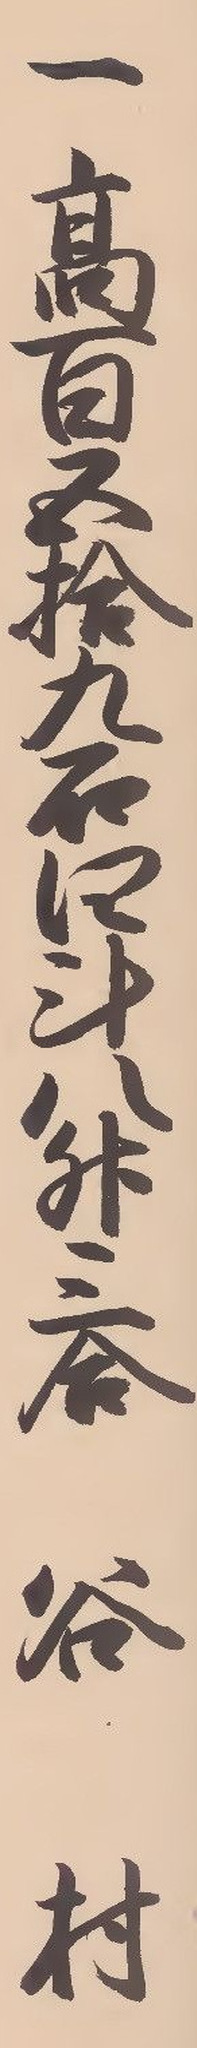一高百五拾九石四斗八升三合谷村
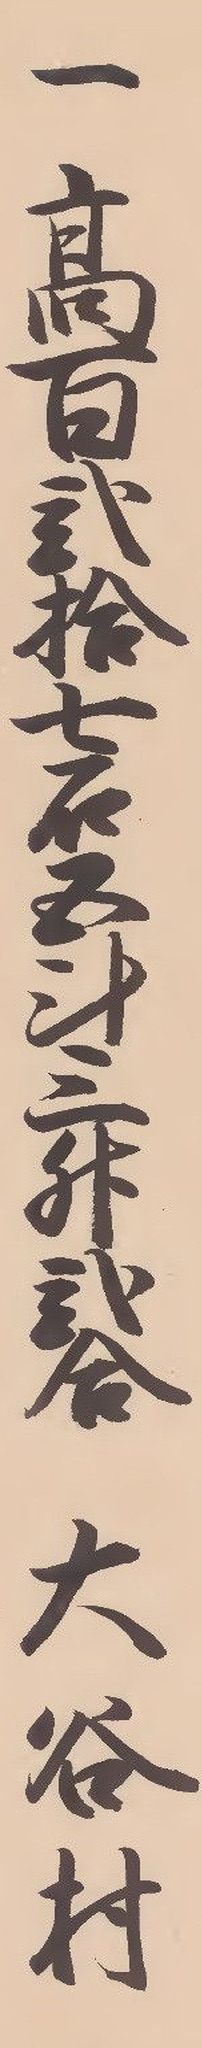一高百弐拾七石五斗三升弐合大谷村
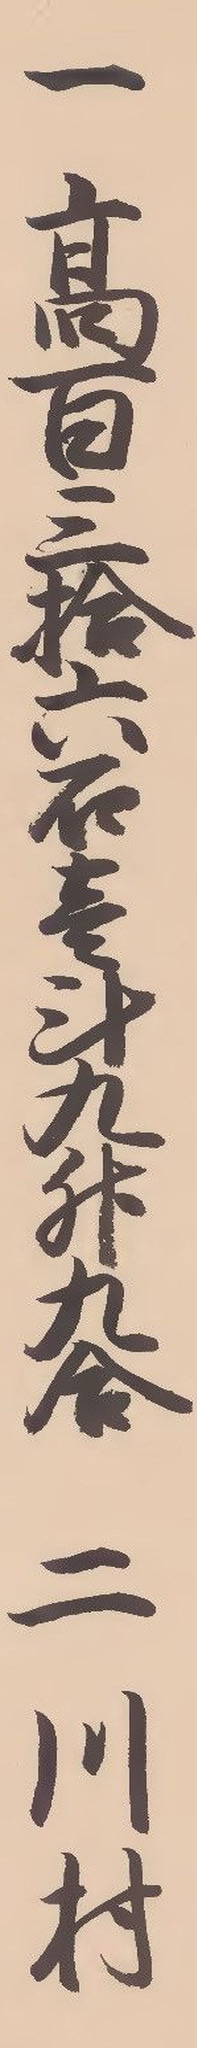一高百三拾六石壱斗九升九合二川村
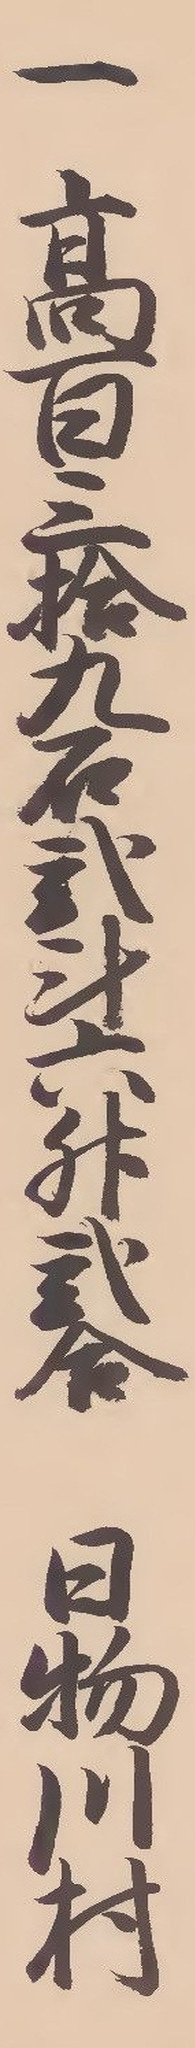一高百三拾九石弐斗六升弐合日物川村

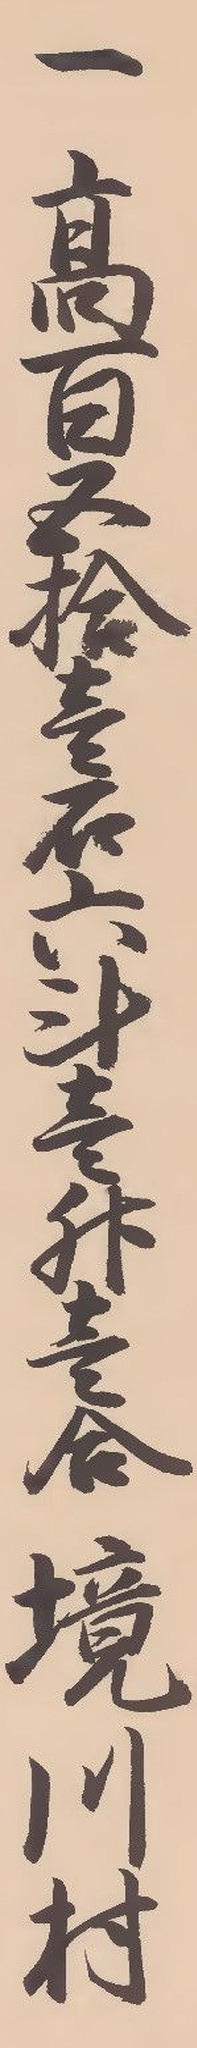一高百五拾壱石六斗壱升壱合境川村
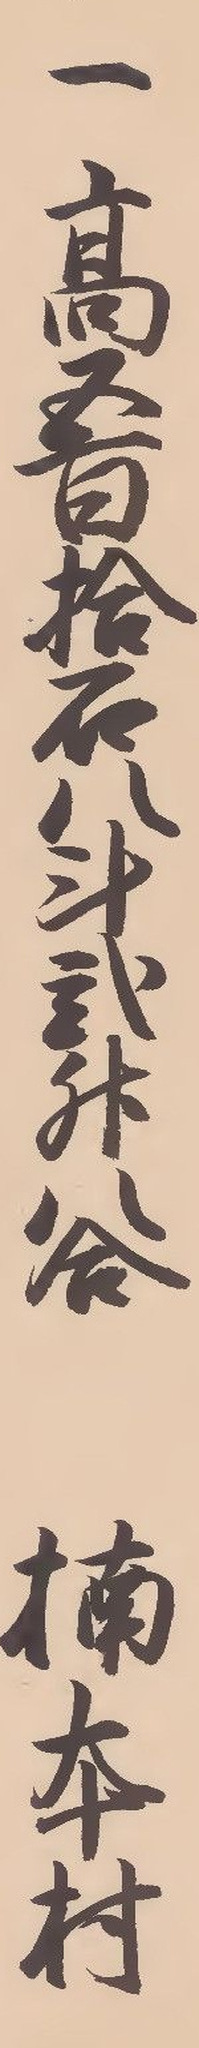一高五百拾石八斗弐升八合楠本村
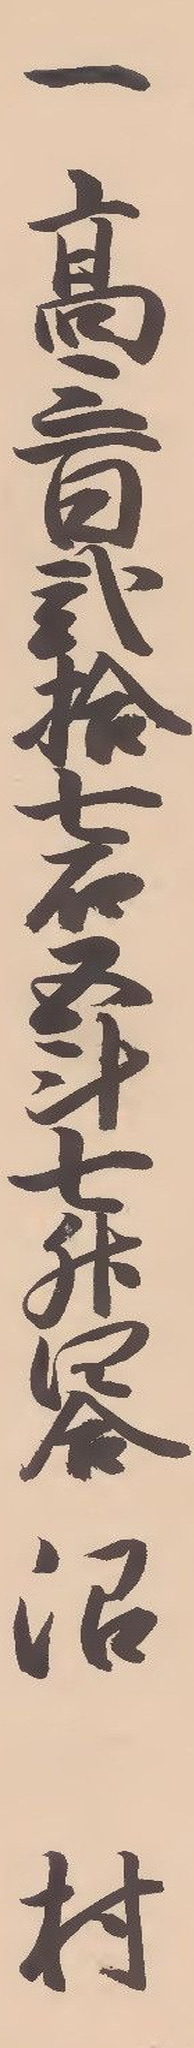一高三百弐拾七石五斗七升四合沼村
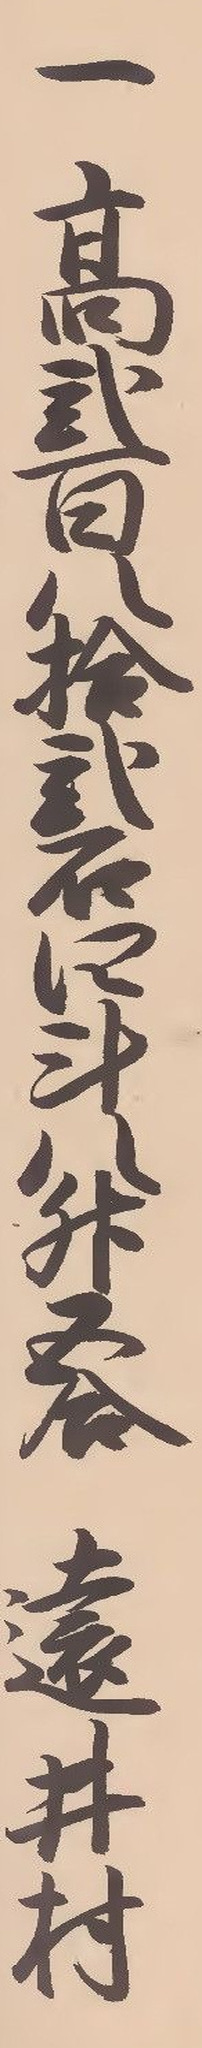一高弐百八拾弐石四斗八升五合遠井村
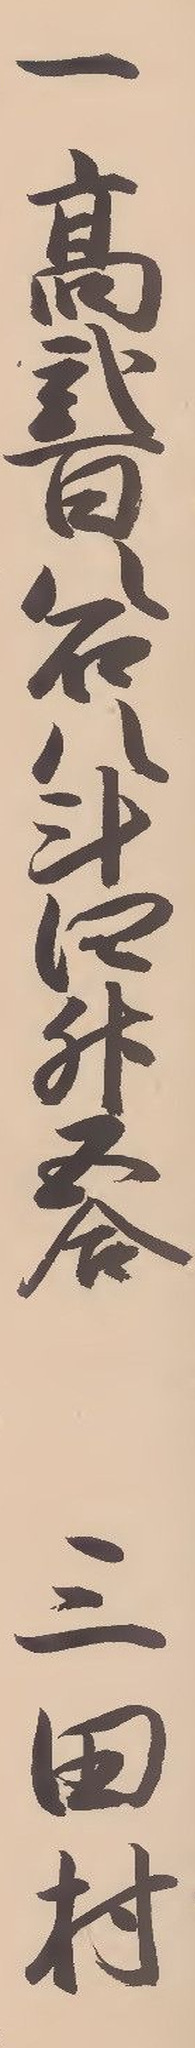一高弐百八石八斗四升五合三田村
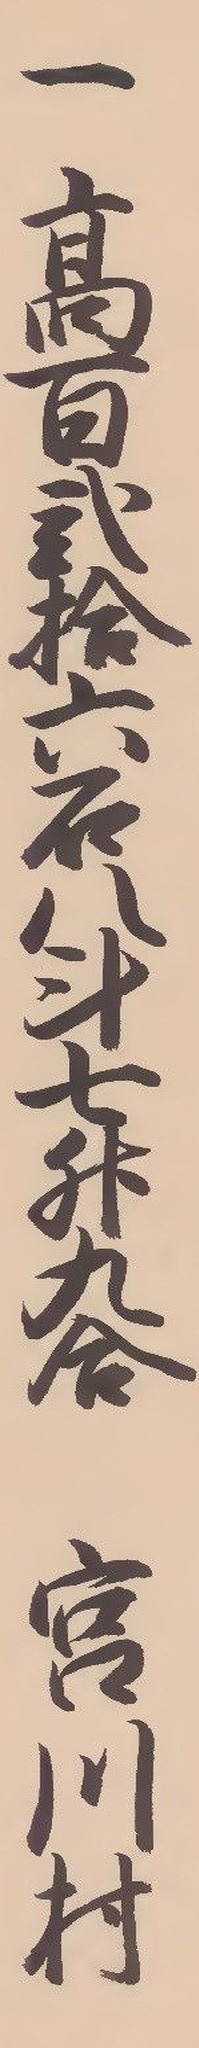一高百弐拾六石八斗七升九合宮川村
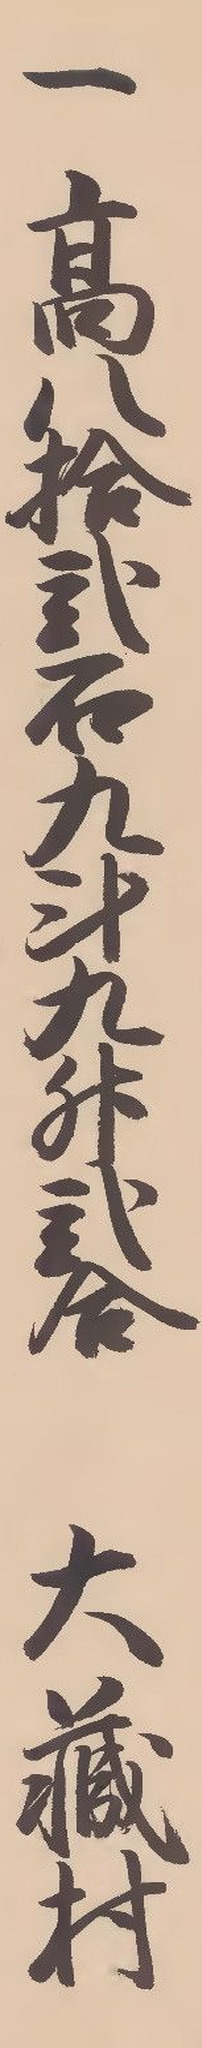一高八拾弐石九斗九升弐合大蔵村
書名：紀伊国郷帳
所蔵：国立公文書館 National Archives of Japan
